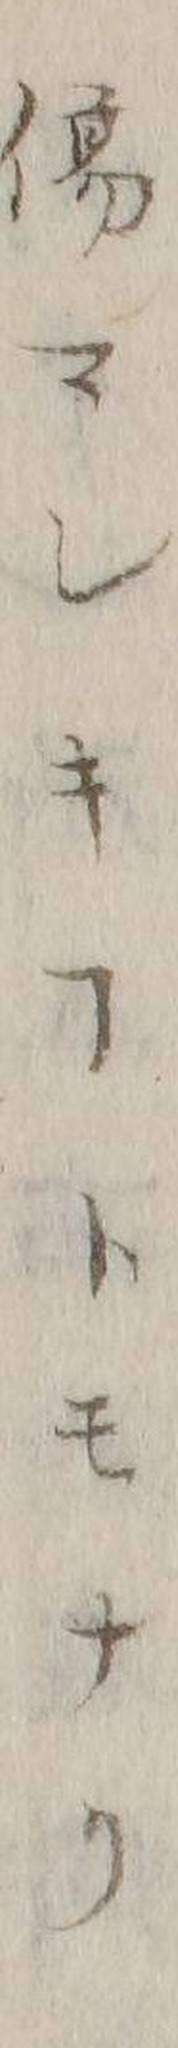傷マシキヿトモナリ
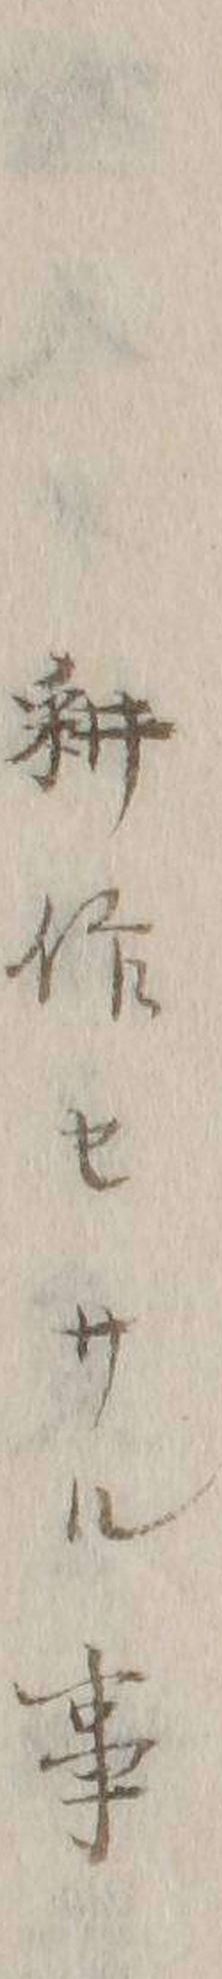耕作セサル事
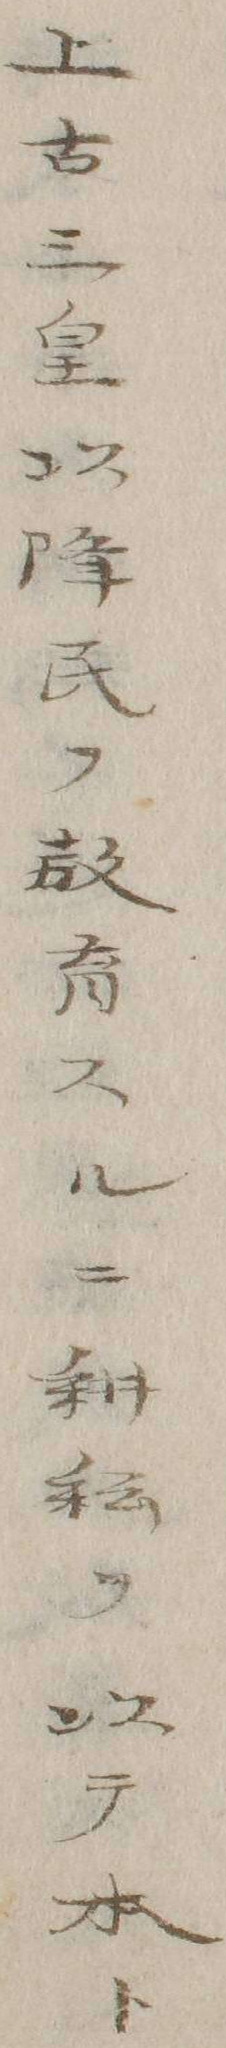上古三皇以降民ヲ教育スルニ耕耘ヲ以テ本ト
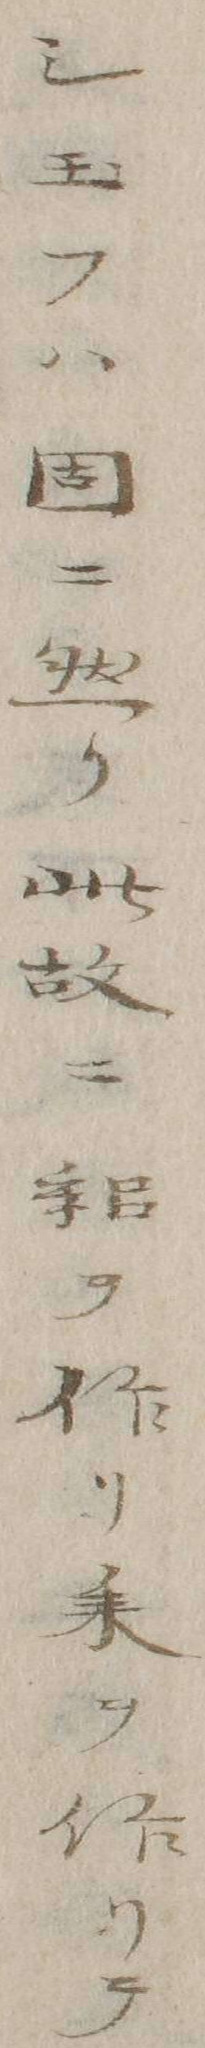シ玉フハ固ニ然リ此故ニ耜ヲ作リ耒ヲ作リテ

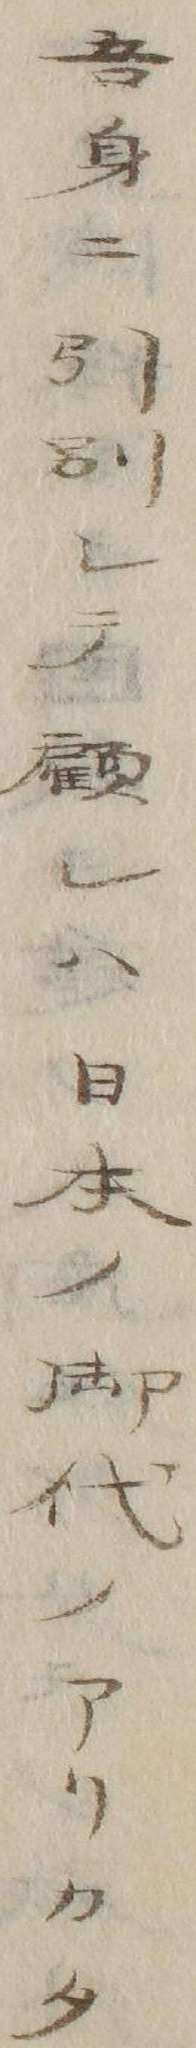吾身ニ引別レテ顧レハ日本ノ御代ノアリカタ
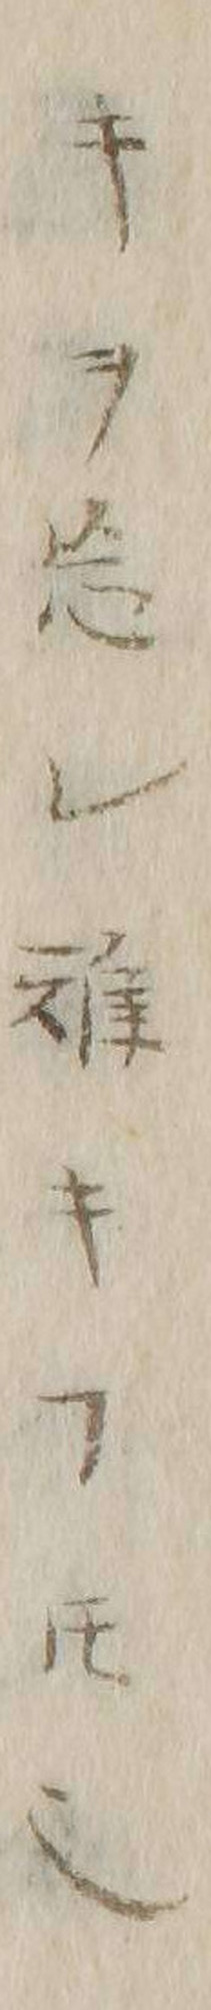キヲ忘レ難キコトトモ也
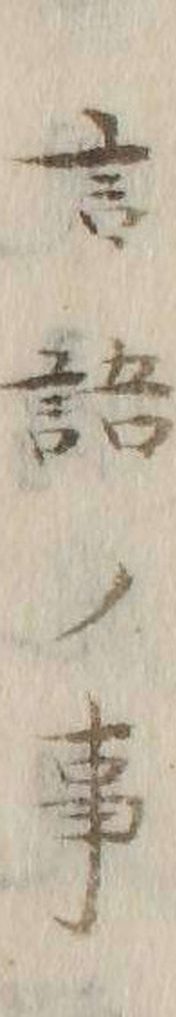言語ノ事
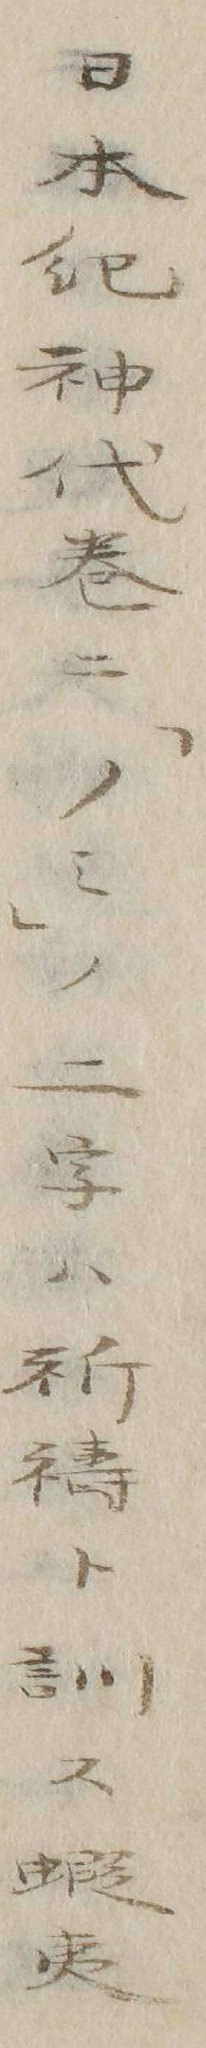日本紀神代巻ニ「ノミ」ノ二字ハ祈祷ト訓ス蝦夷
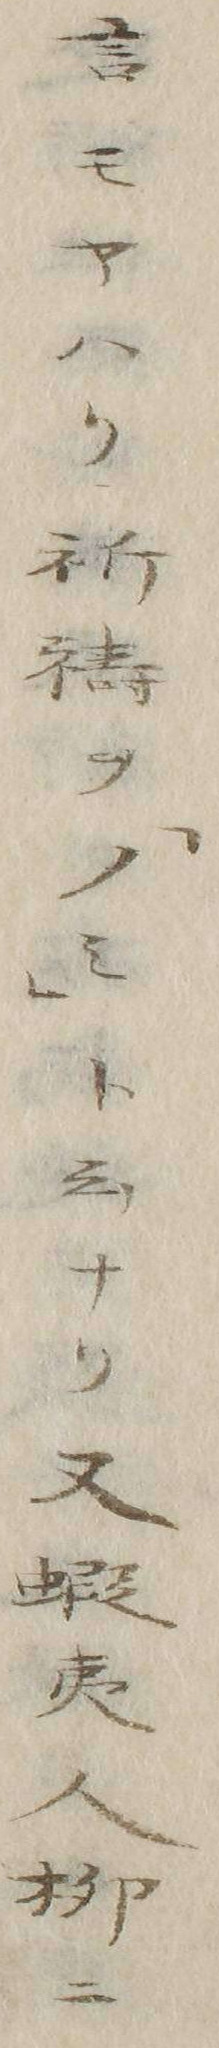言モヤアハリ祈祷ヲ「ノミ」ト云ナリ又蝦夷人柳ニ
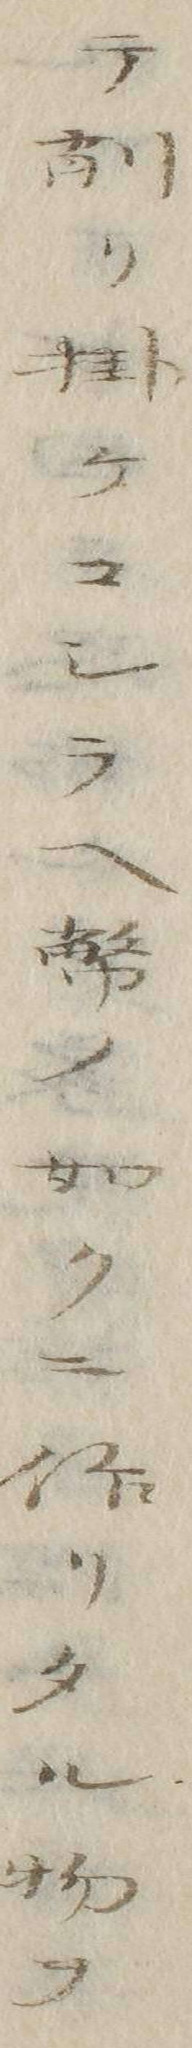テ削リ掛ケコシラヘ幣ノ如クニ作リタル物ヲ
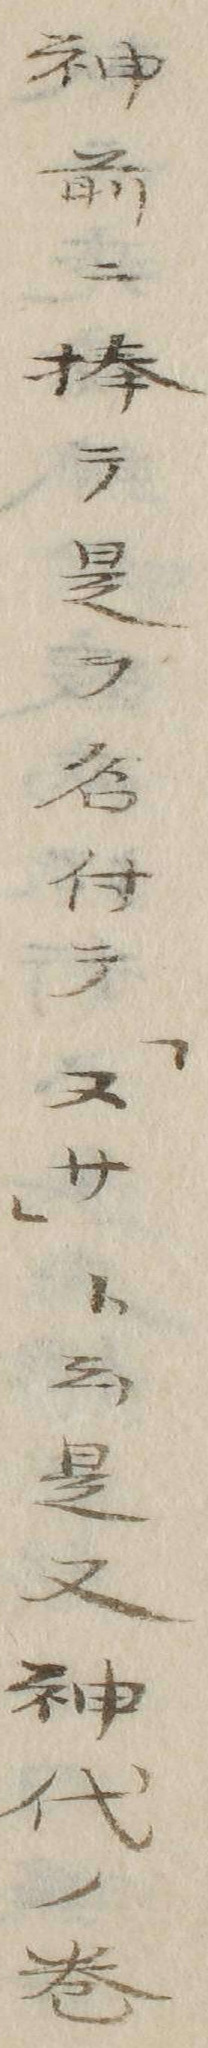神前ニ捧テ是ヲ名付テ「ヌサ」ト云是又神代ノ巻
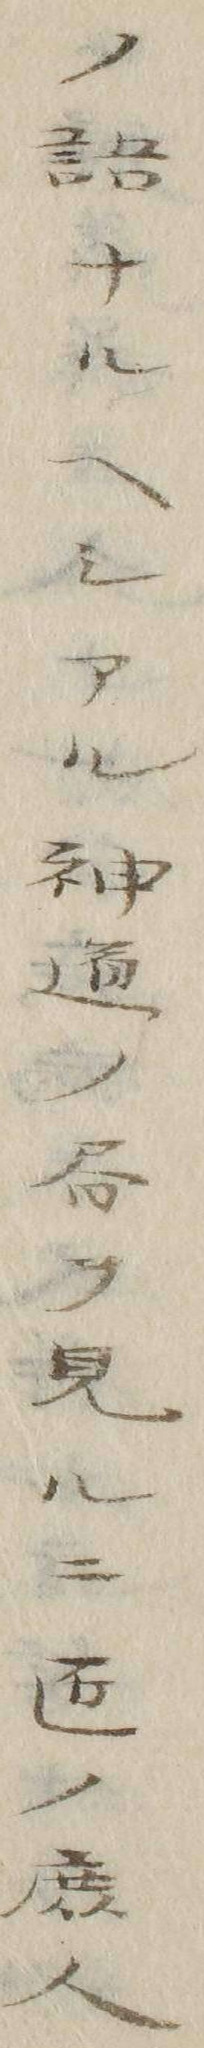ノ語ナルヘシアル神道ノ書ヲ見ルニ匠ノ庶人
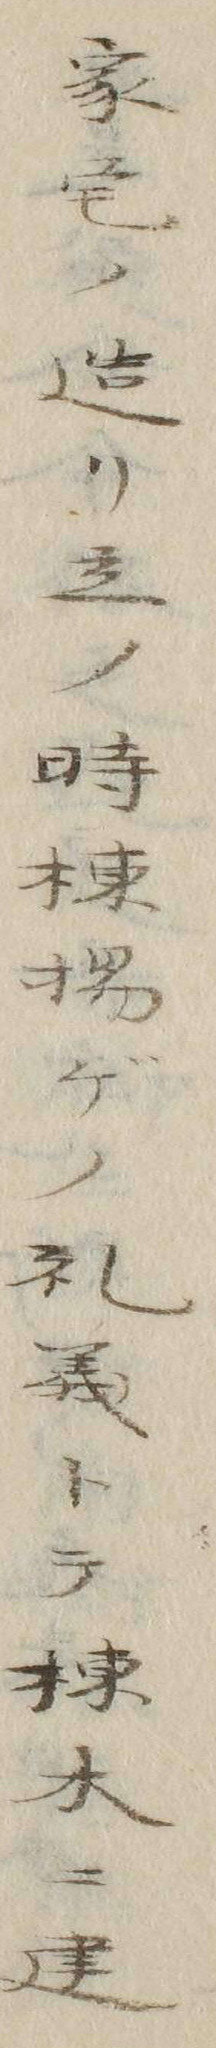家宅ヲ造リ立ノ時棟揚ゲノ礼義トテ棟木ニ建
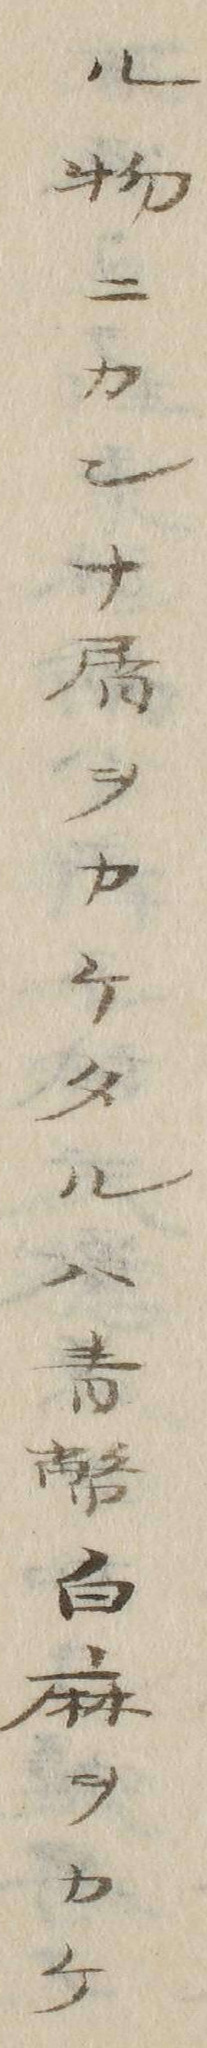ル物ニカンナ屑ヲカケタルハ青幣白麻ヲカケ
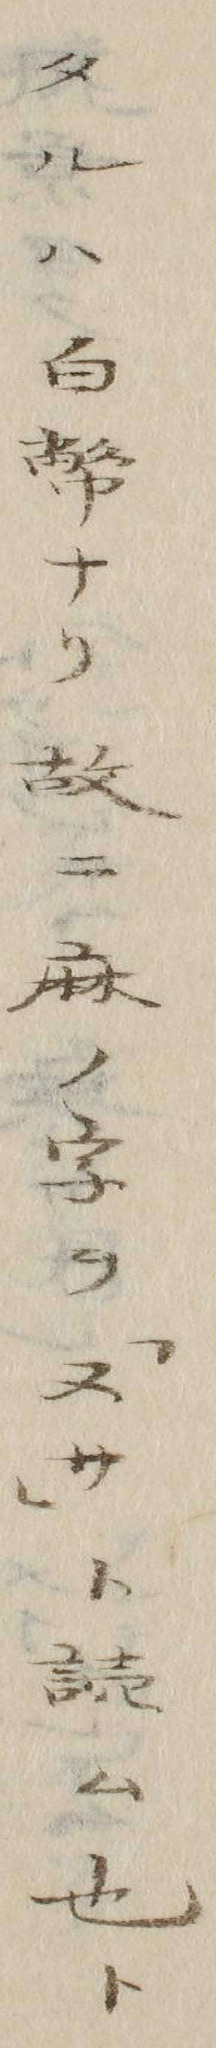タルハ白幣ナリ故ニ麻ノ字ヲ「ヌサ」ト読ム也ト
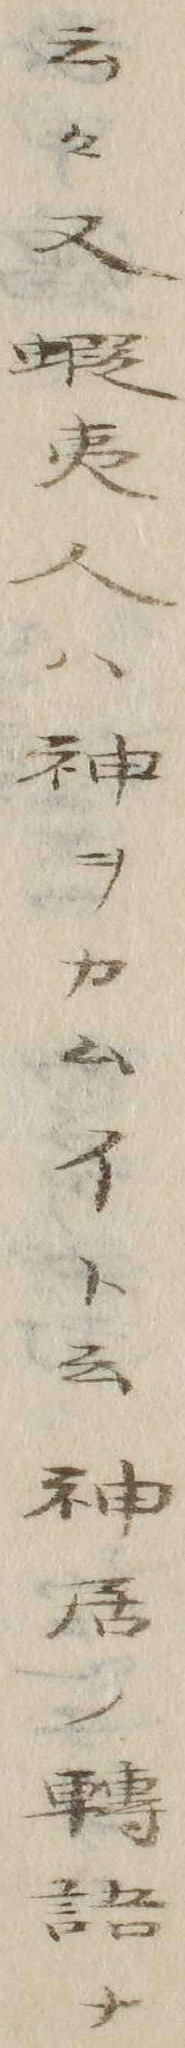云々又蝦夷人ハ神ヲカムイト云神居ノ転語ナ
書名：蝦夷草紙（国文学研究資料館）
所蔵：国文学研究資料館
